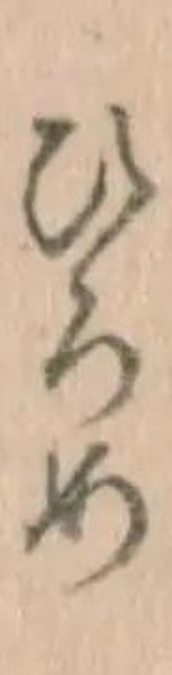ひろめ
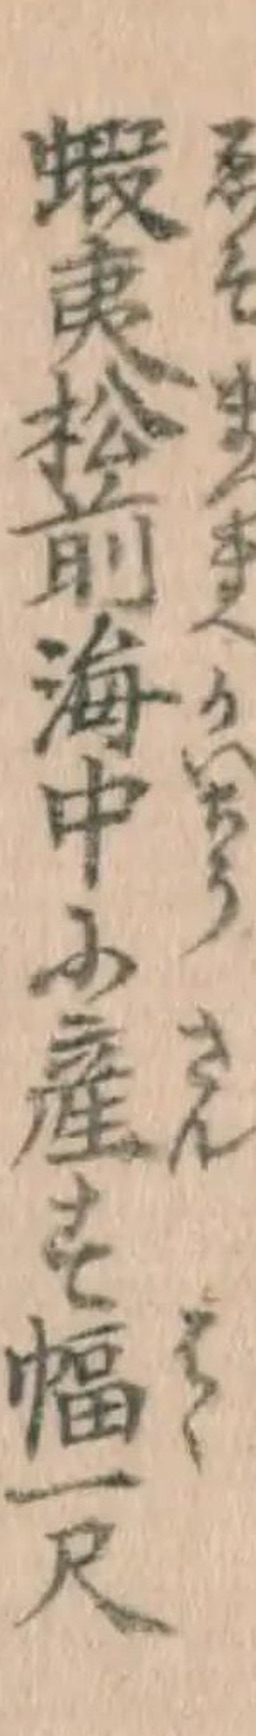蝦夷松前海中に産す幅一尺
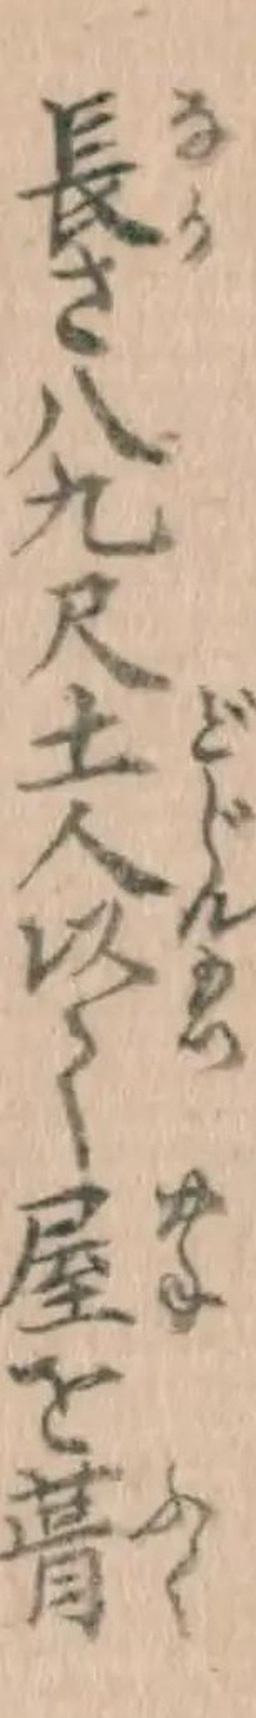長さ八九尺土人以て屋を葺
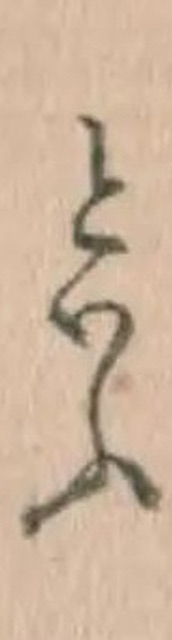といふ

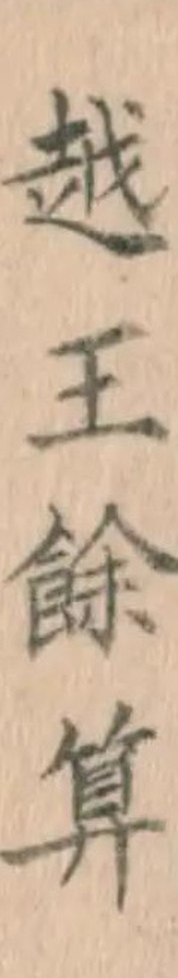越王余算
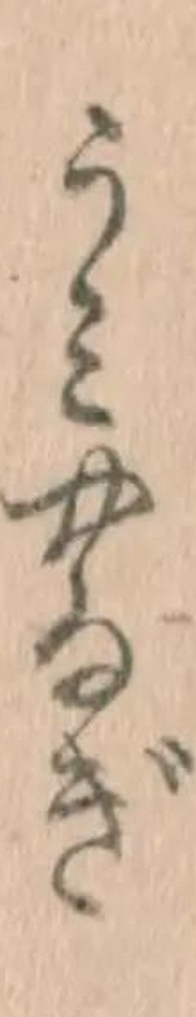うみやなぎ
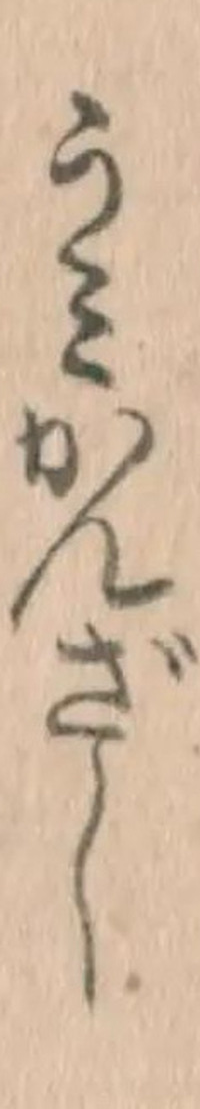うみかんざし
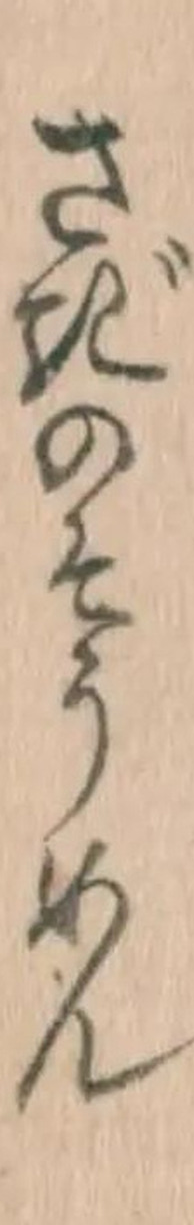さぎのそうめん
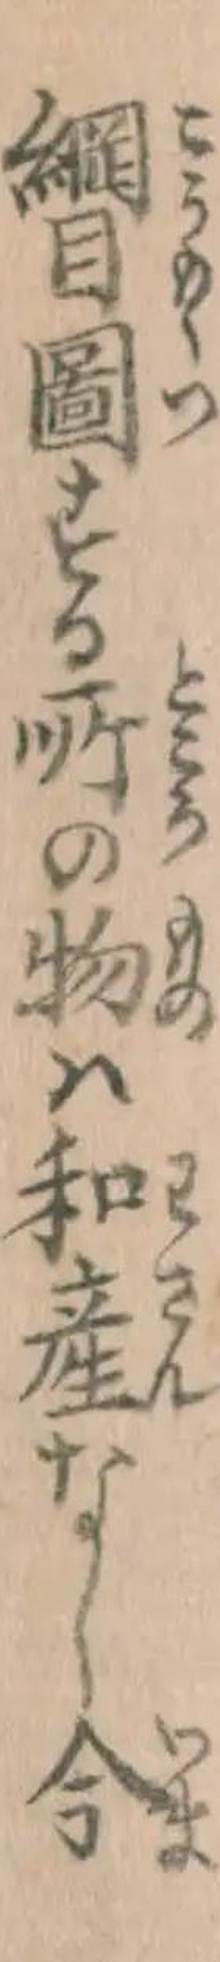綱目図する所の物は和産なし今
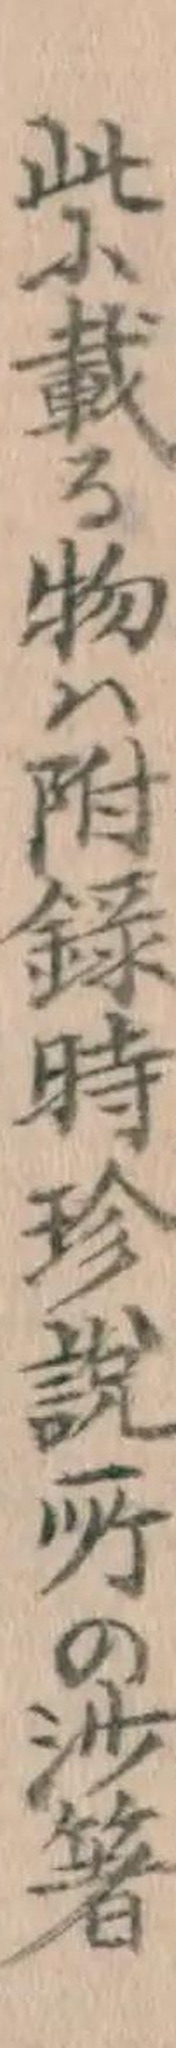此に載る物は附録時珍説所の沙箸
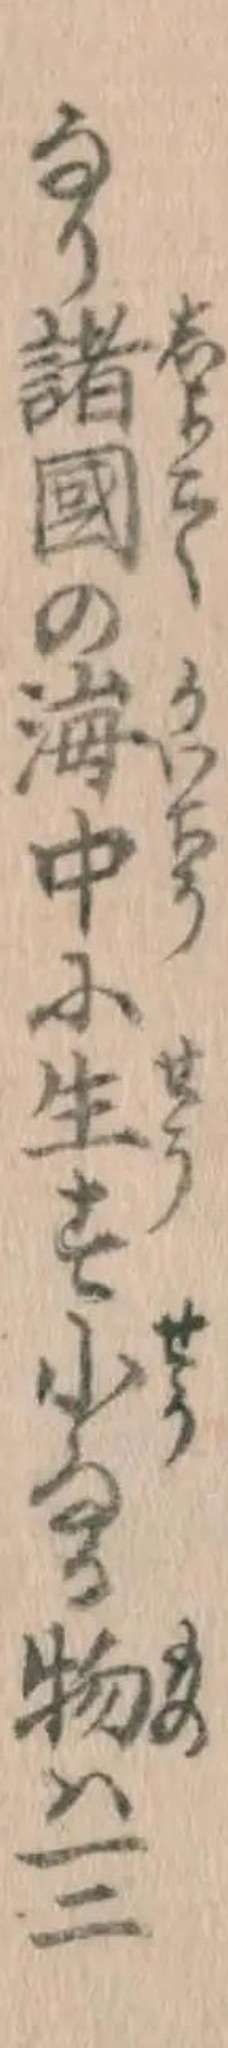なり諸国の海中に生す小なる物は一二
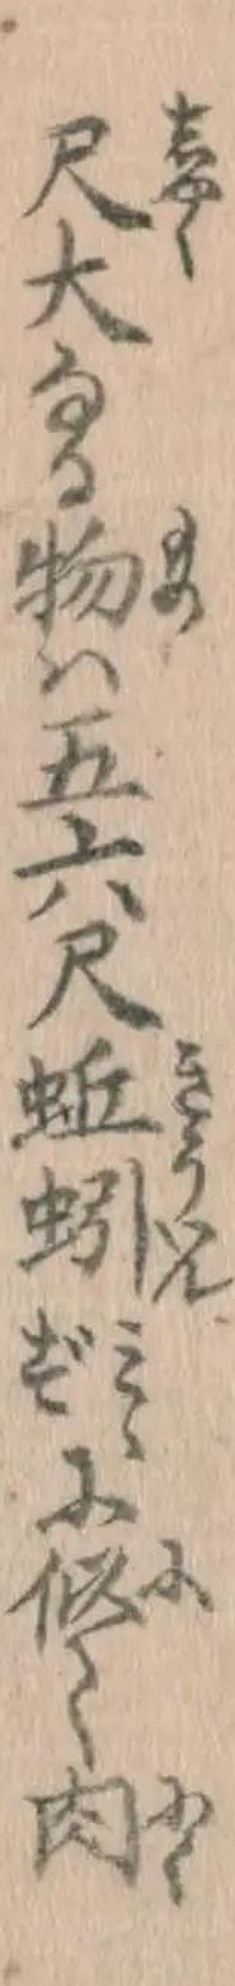尺大なる物は五六尺蚯蚓みゝずに似て肉
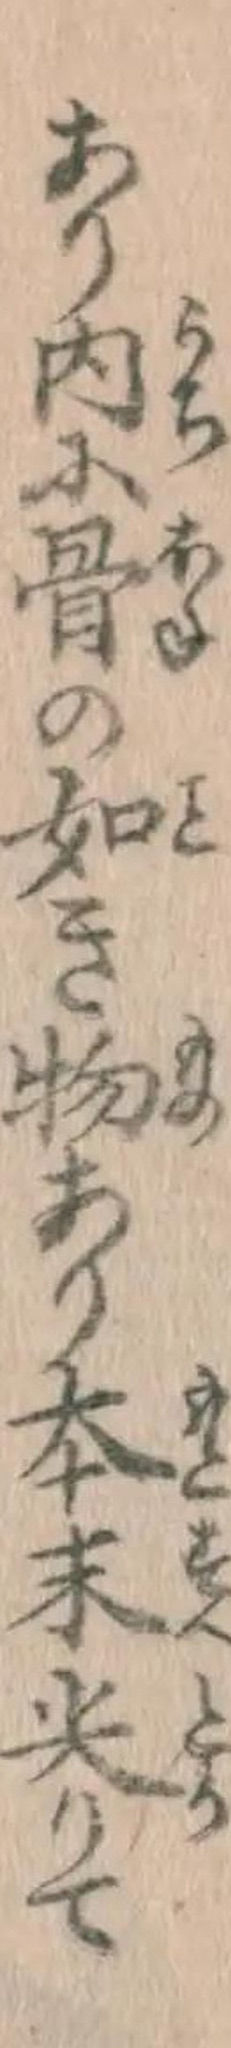あり内に骨の如き物あり本末尖りて
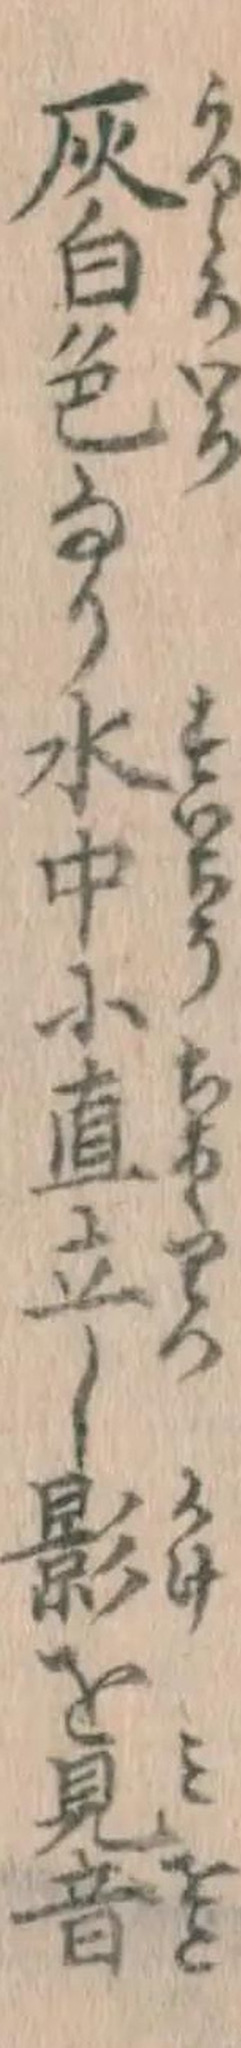灰白色なり水中に直立し影を見音
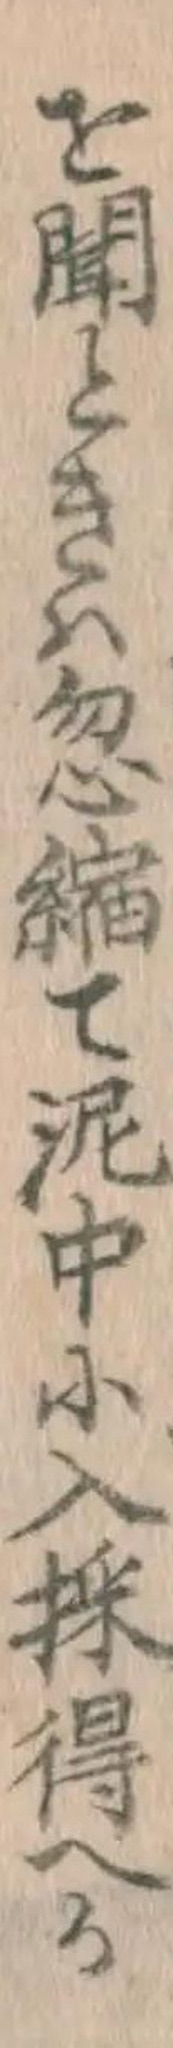を聞ときは忽縮て泥中に入採得へる
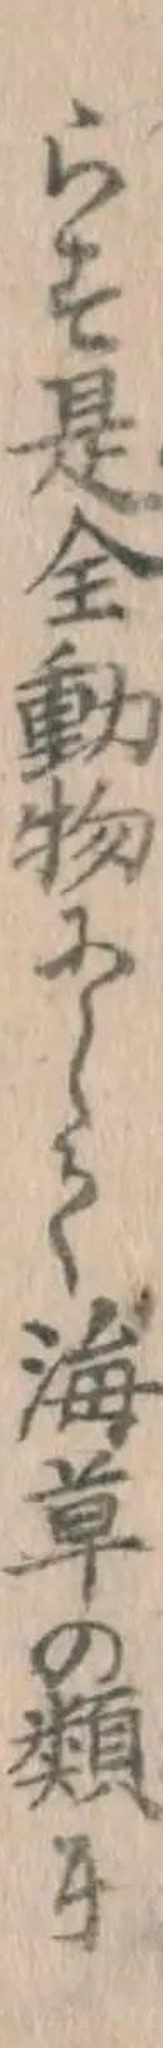らす是全動物にして海草の類に
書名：本草図譜. 巻34-36
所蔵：国立国会図書館 National Diet Library, JAPAN
